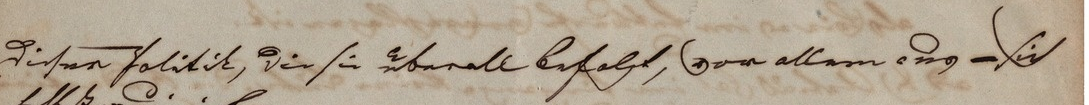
dieser Politik, die sie überall befolgt, vor allem aus – sich
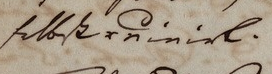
selbst ruinirt.
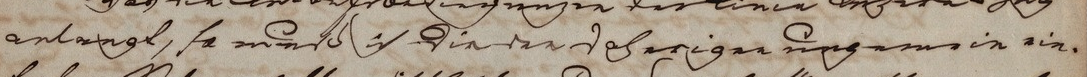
anlangt, so muß ich dir den daherigen ungemein ein-
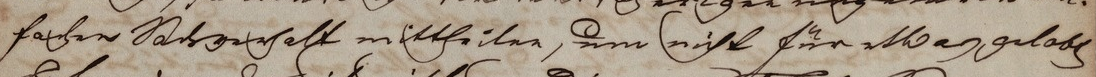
fachen Sachverhalt mittheilen, um nicht für etwas gelobt
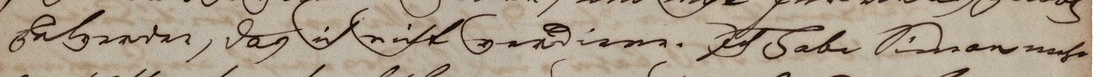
zu werden, das ich nicht verdiene. Ich habe Simon mehr
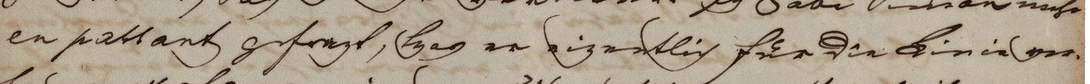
en passant gefragt, was er eigentlich für die Linie ver-
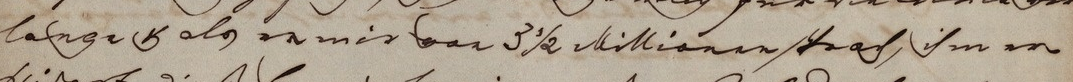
lange & als er mir von 3 ½ Millionen sprach, ihm er-
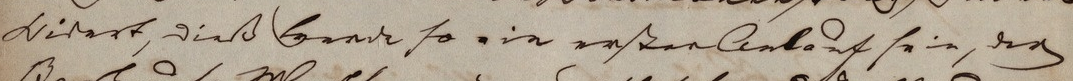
widert, dieß werde so ein erster Anlauf sein, der
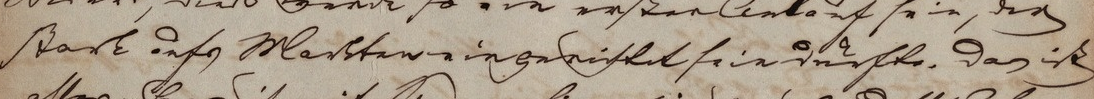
stark aufs Markten eingerichtet sein dürfte. Das ist
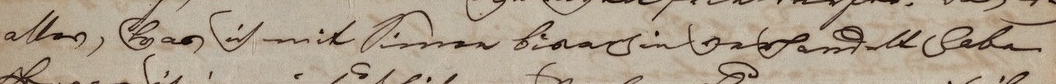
alles, was ich mit Simon bisanhin verhandelt habe.
